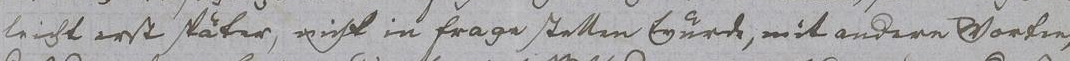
leicht erst später, nicht in Frage stellen würde, mit andern Worten,
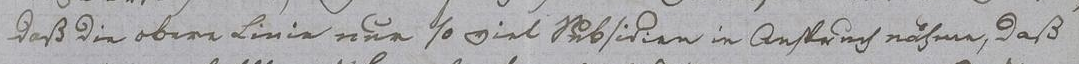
daß die obere Linie nun so viel Subsidien in Anspruch nähme, daß
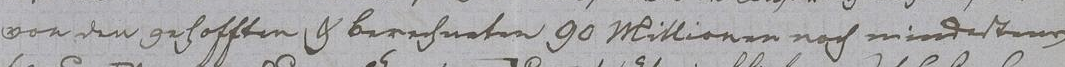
von den gehofften & berechneten 90 Millionen noch mindestens
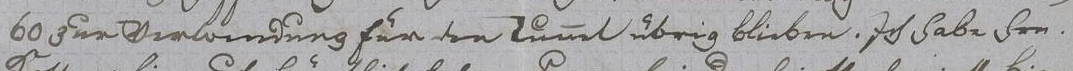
60 zur Verwendung für den Tunnel übrig blieben. Ich habe Hrn.
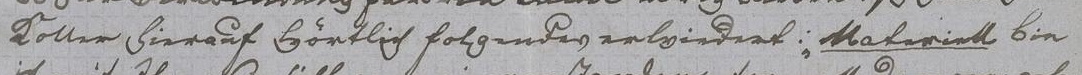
Koller hierauf wörtlich folgendes erwiedert: «Materiell bin
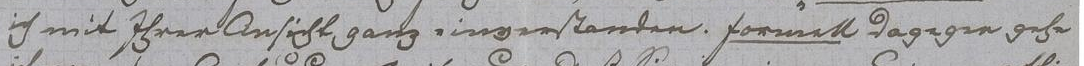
ich mit Ihrer Ansicht ganz einverstanden. Formell dagegen gehe
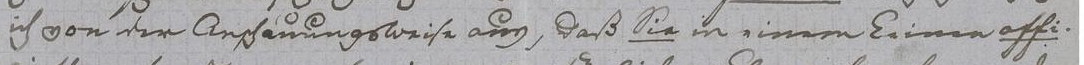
ich von der Anschauungsweise aus, daß Sie in einem keinen offi
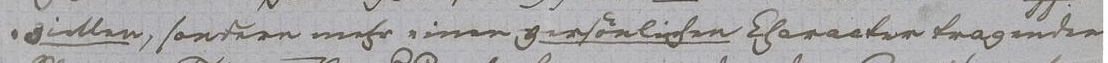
ziellen, sondern mehr einen persönlichen Character tragender
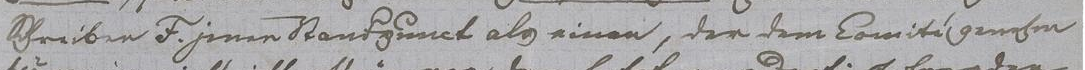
Schreiben F. jener Standpunct als einen, der dem Comité genehm
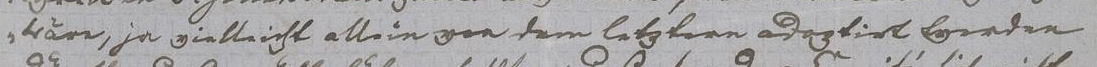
wäre, ja vielleicht allein von dem letztern adoptirt werden
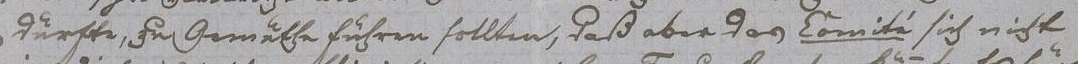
dürfte, zu Gemüthe führen sollten, daß aber das Comité sich nicht
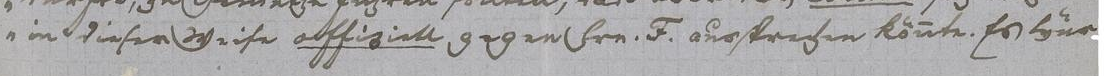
in dieser Weise offiziell gegen Hrn. F. aussprechen könnte. Es wür-
